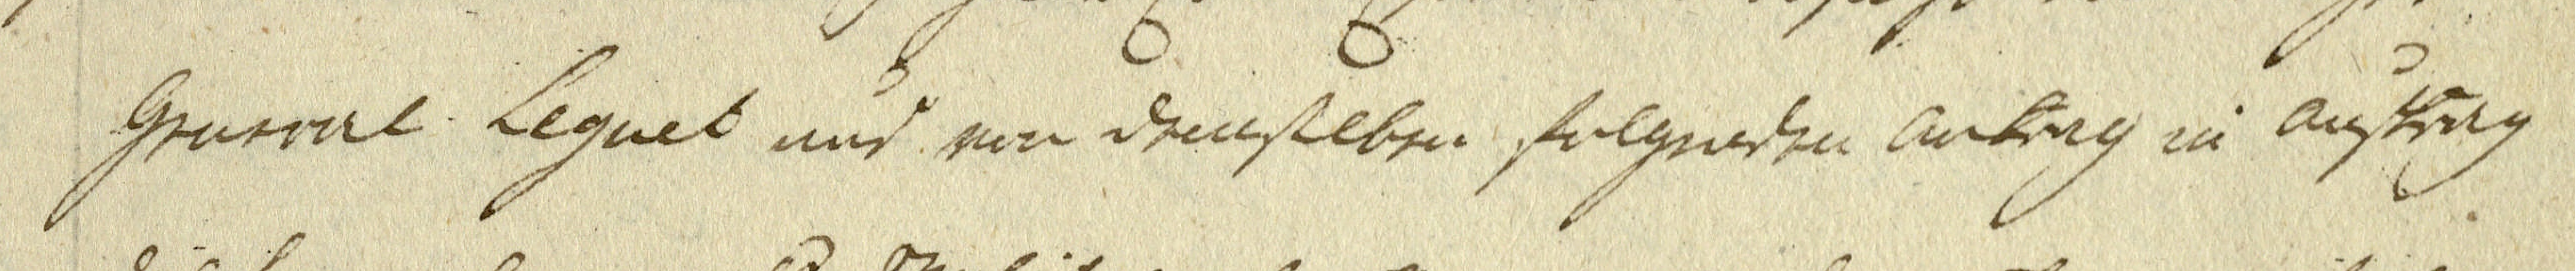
General Leguet und von demselben folgenden Antrag in Auftrag
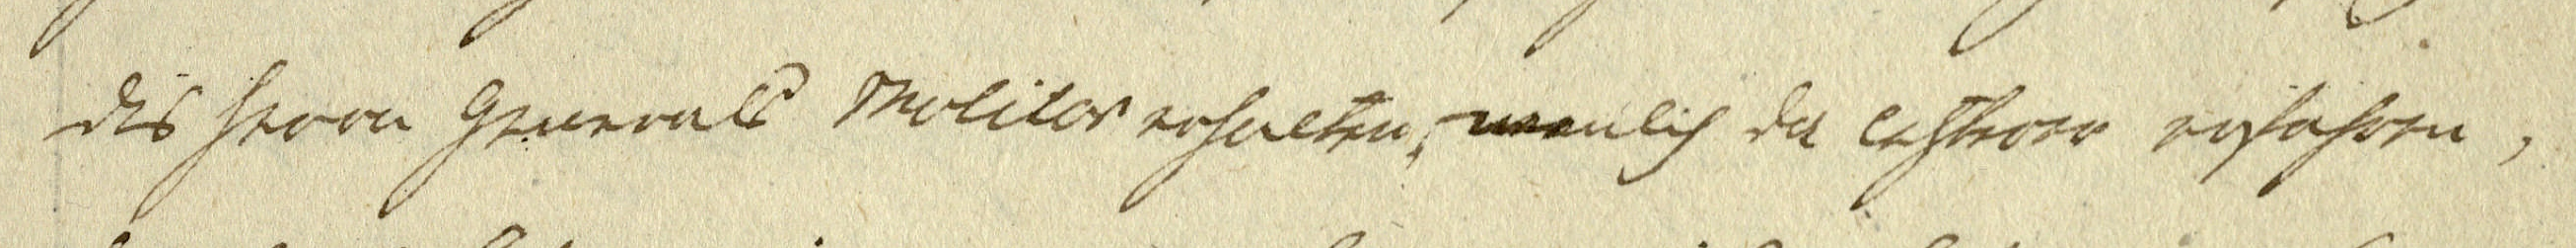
des Herrn Generals Molitor erhalten, nemlich da letzterer erfahren,
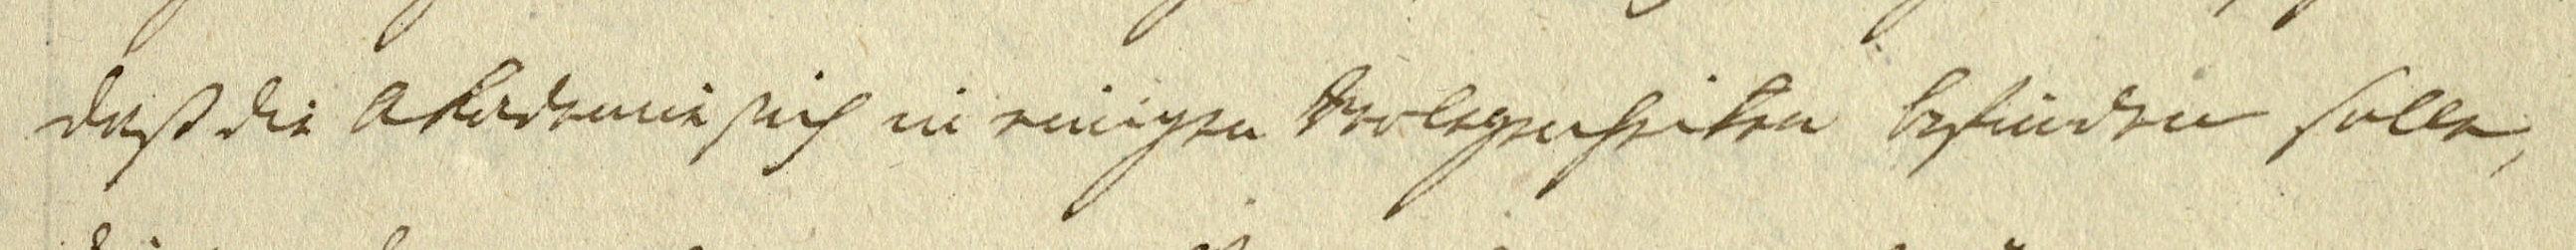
daß die Akademie sich in einigen Verlegenheiten befinden solle,
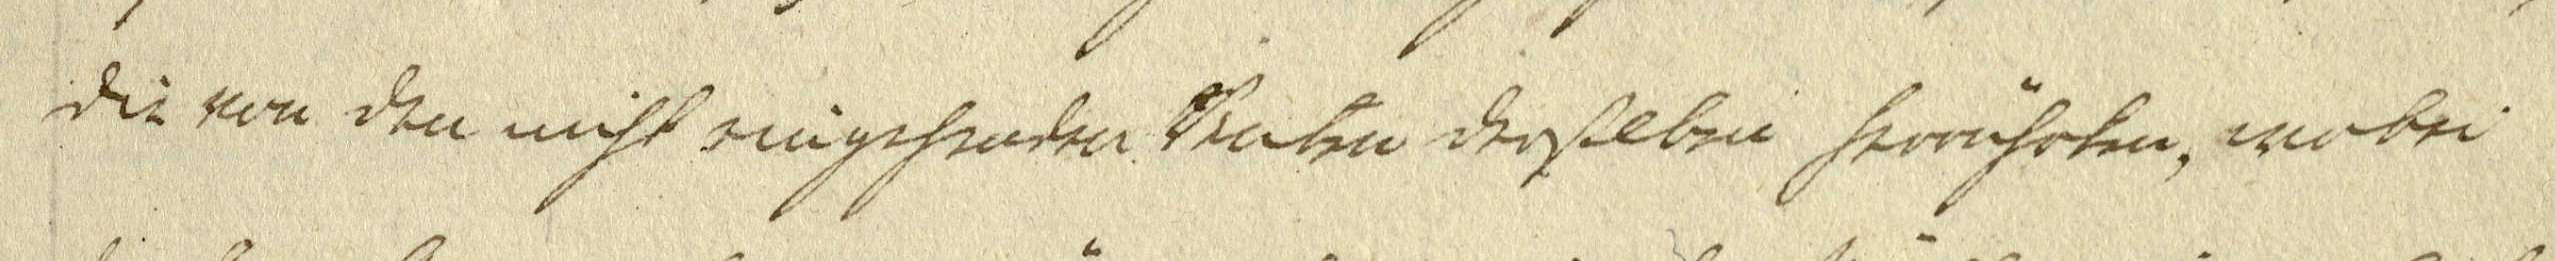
die von den nicht eingehenden Renten derselben herrührten, wobei
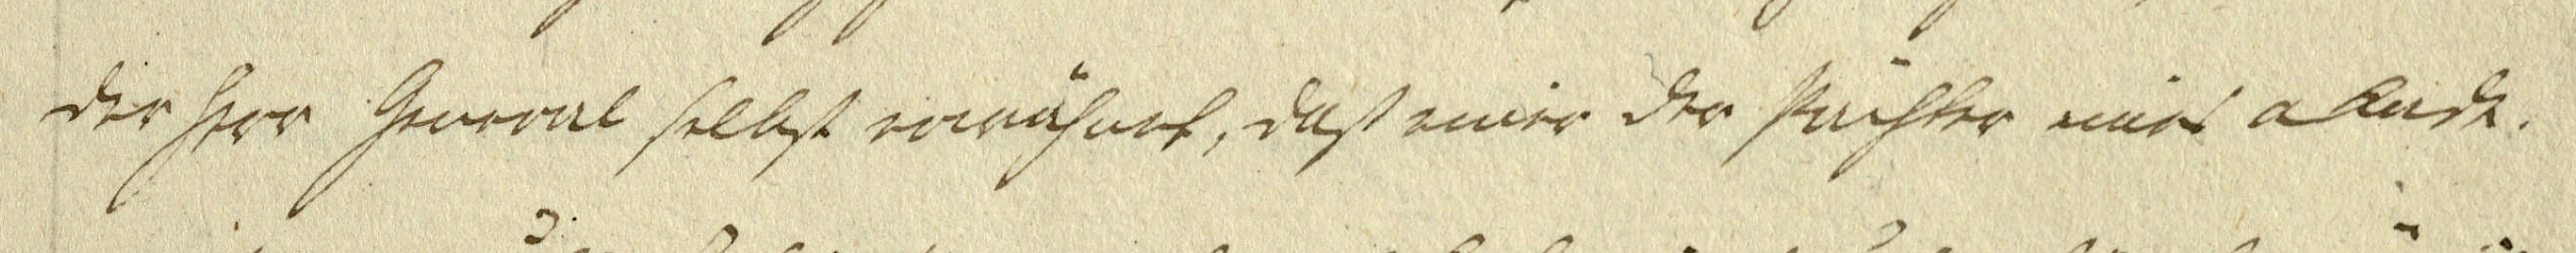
der Herr General selbst erwähnet, daß einer der Pächter eines akade¬
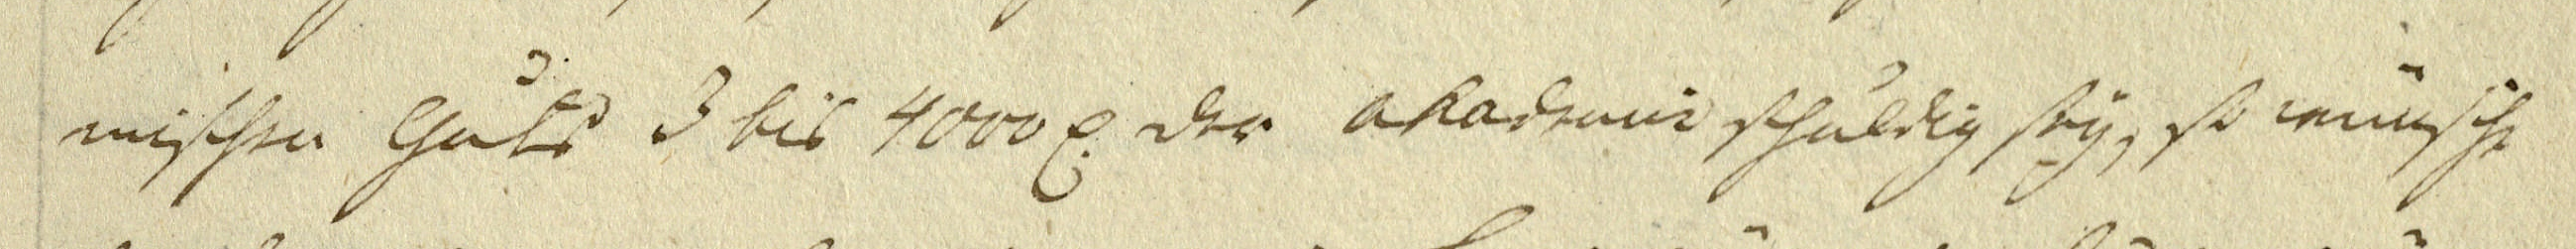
mischen Guths 3 bis 4000 l. der Akademie schuldig seÿ, so wünsche
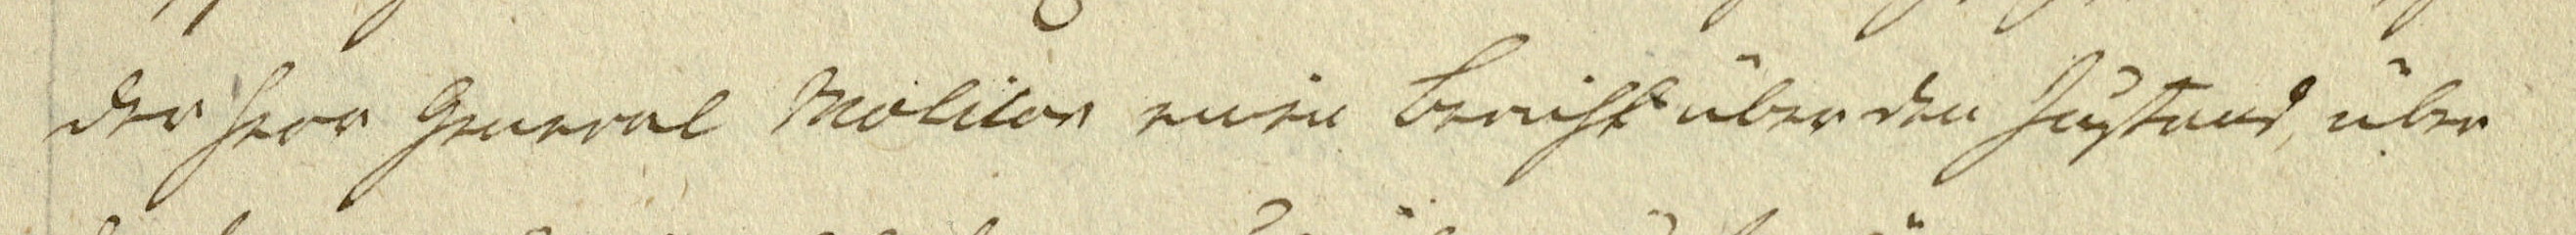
der Herr General Molitor einen Bericht über den Zustand, über
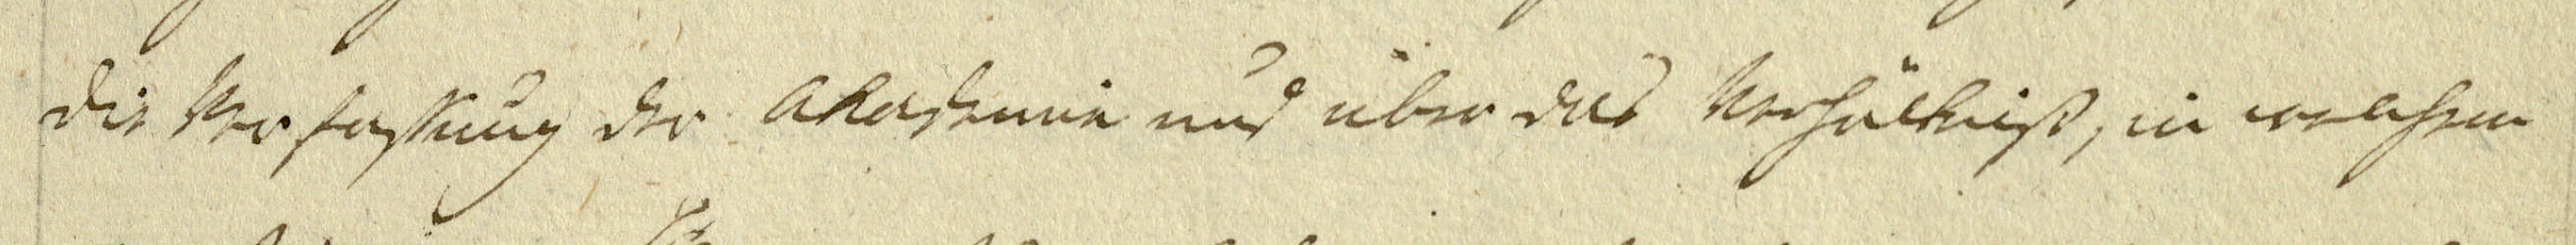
die Verfassung der Akademie und über das Verhältniß, in welchem
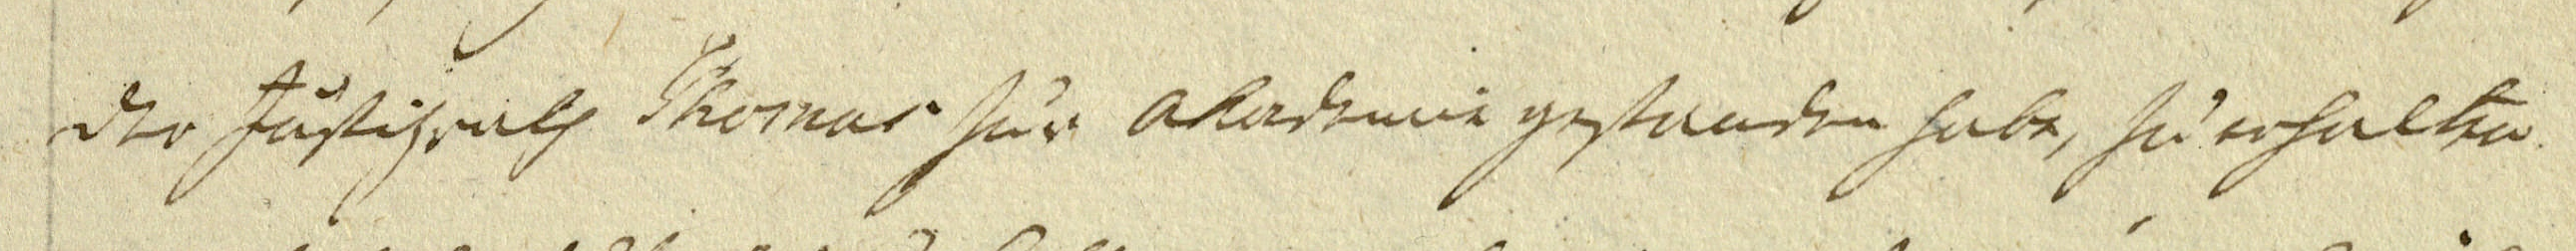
der Justizrath Thomas zur Akademie gestanden habe, zu erhalten.
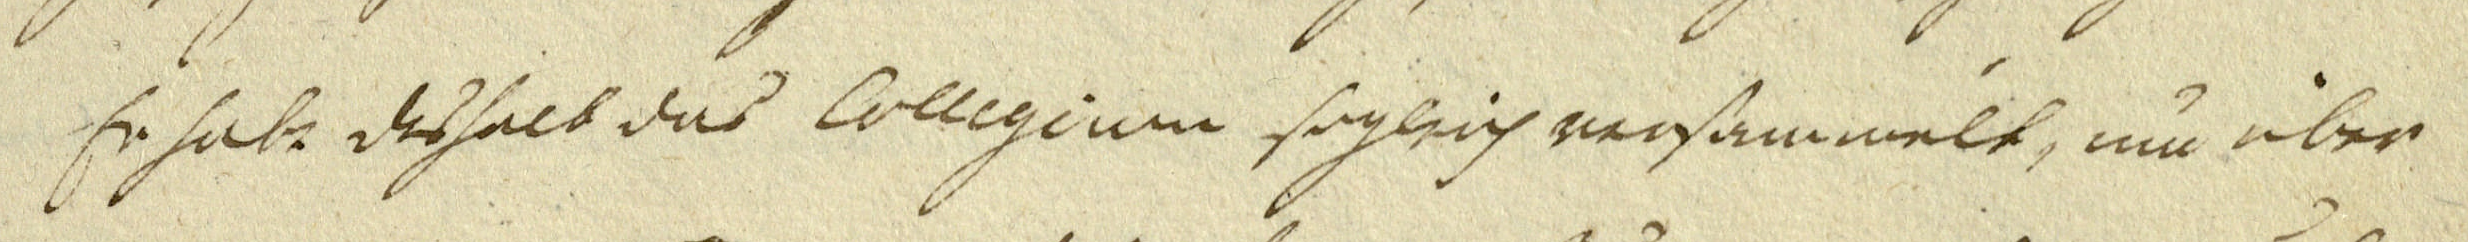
Er habe deshalb das Collegium sogleich versammelt, um über
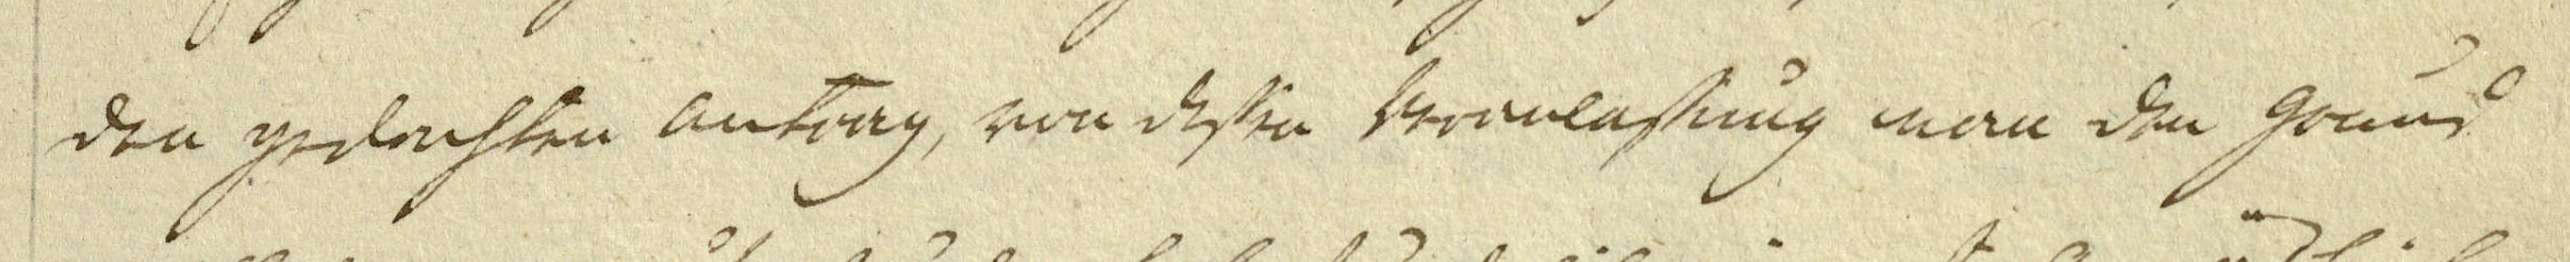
den gedachten Antrag, von dessen Veranlassung man den Grund
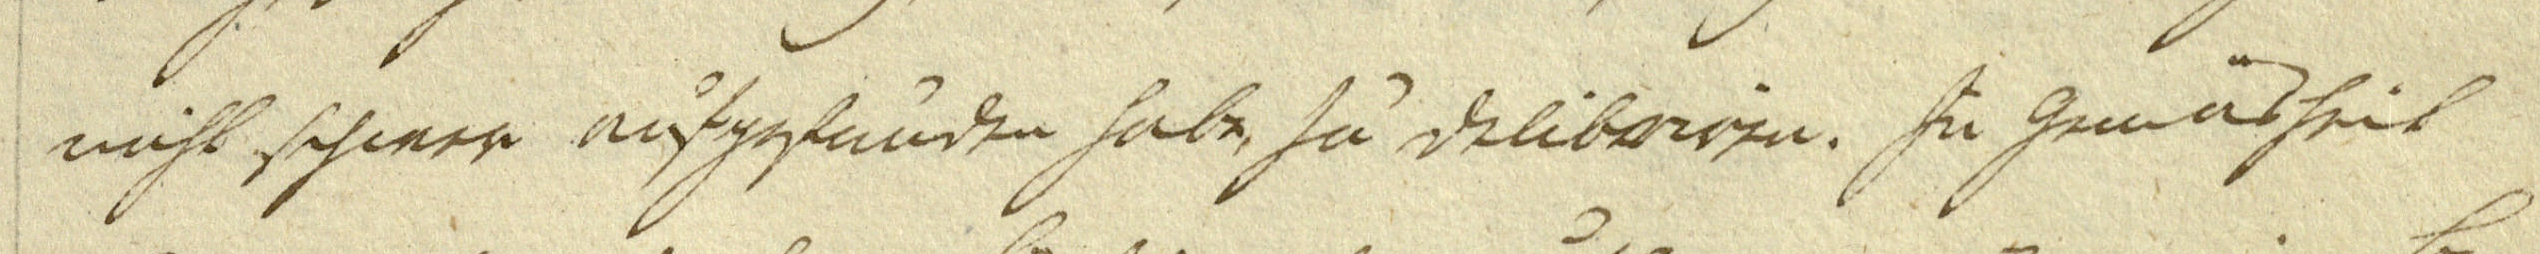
nicht schwer aufgefunden habe, zu deliberiren. In Gemäsheit
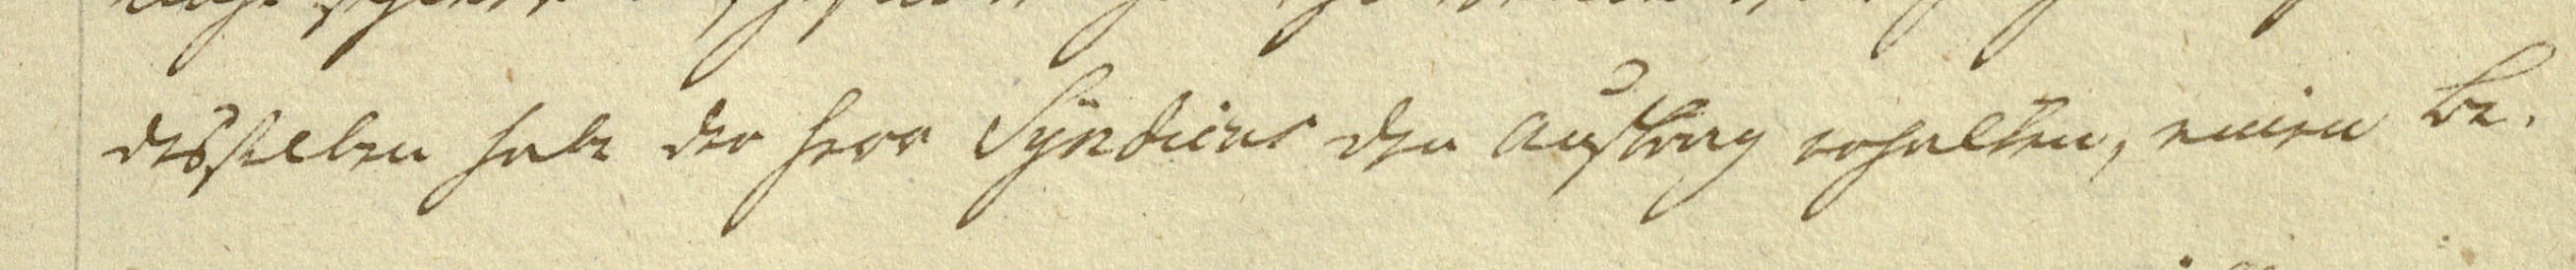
desselben habe der Herr Sÿndicus den Auftrag erhalten, einen Be¬
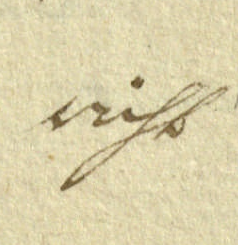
richt
